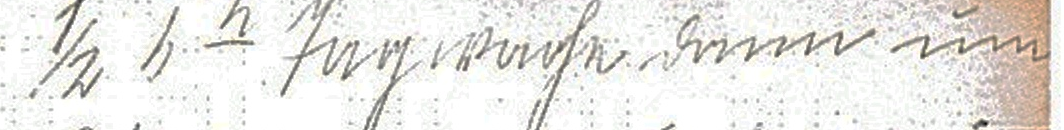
1/5 h Tagwache dann um
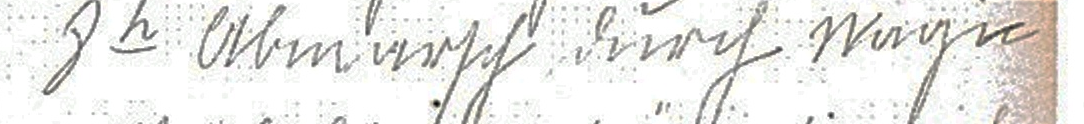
8h Abmarsch durch Nagy
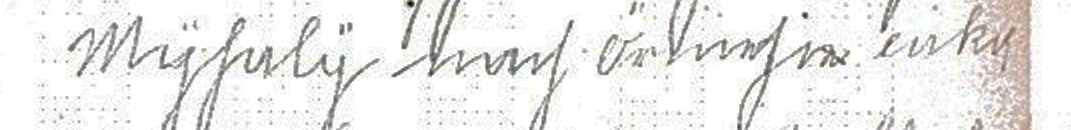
Myhaly nach Örinsi cirka
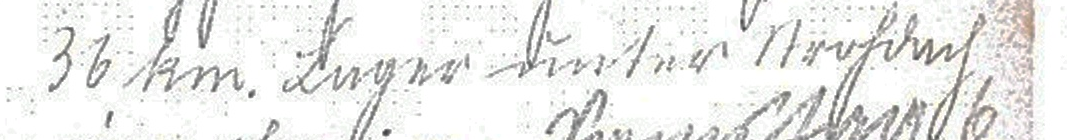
36 km. Lager unter Strohdach
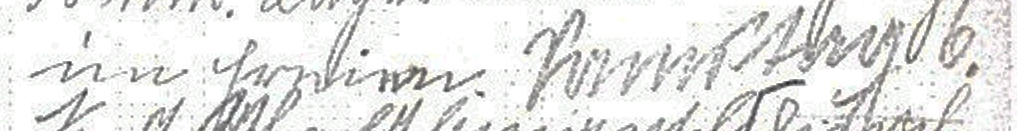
in Srein. Samstag 6.
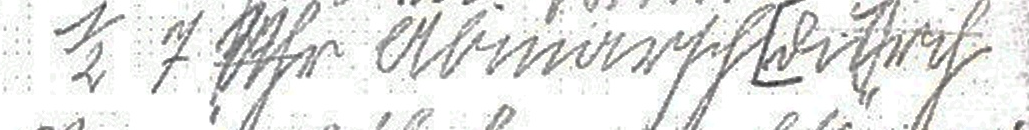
1/2 7 Uhr Abmarsch durch
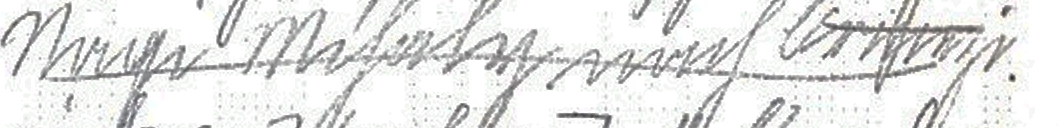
Nagy Mihaly nach Ör
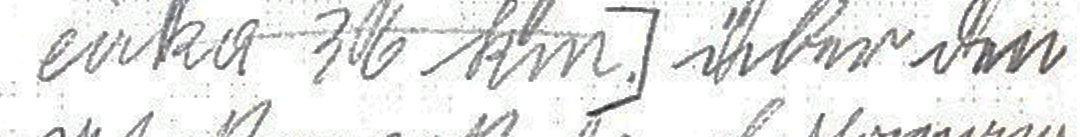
cirka 36 km. Über den
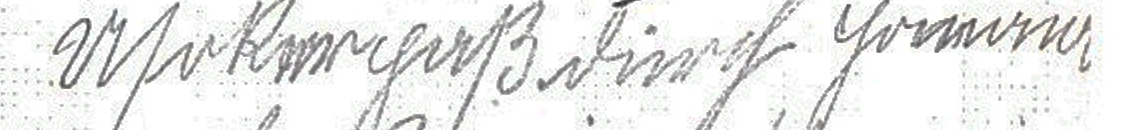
Ahvkerpass durch Jormini
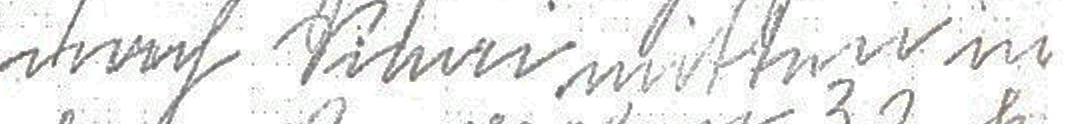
nach Simri mitten in
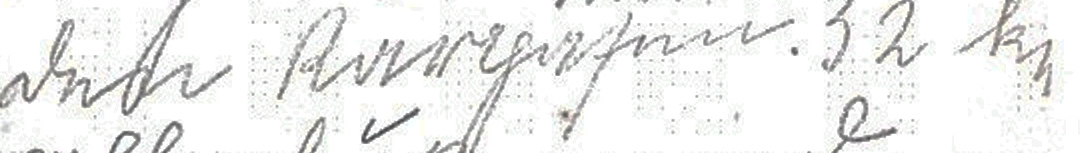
den Karpaten. 32km
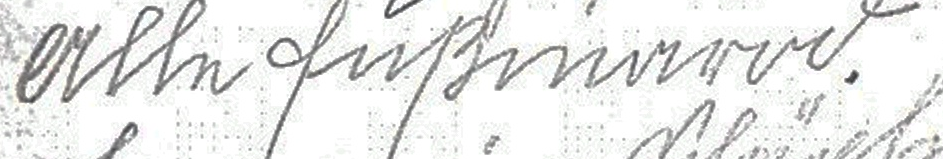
Alle fußmarod. Lager in Schupfen.
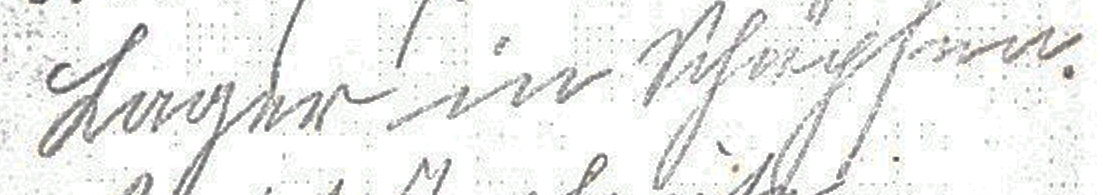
Sonntag 7. Heute
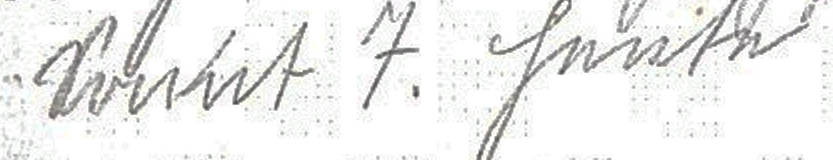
Rasttag.
